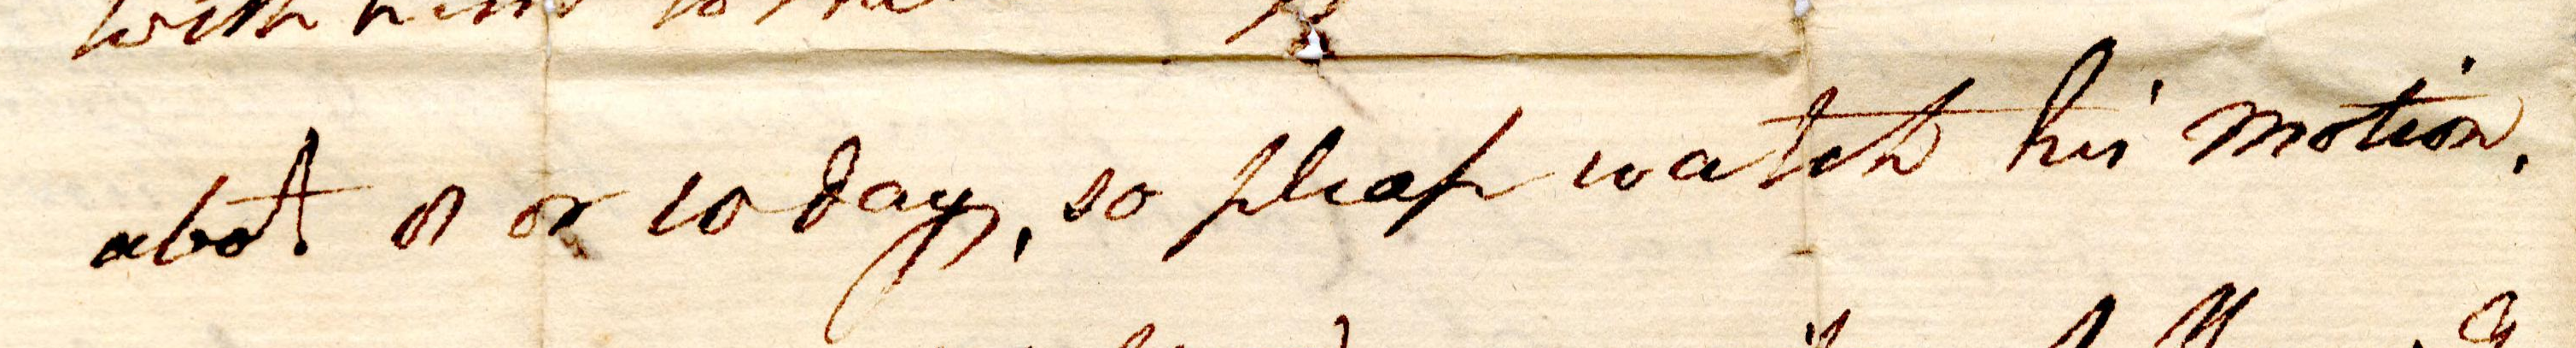abo^t. 8 or 10 day, so please watch his motion.
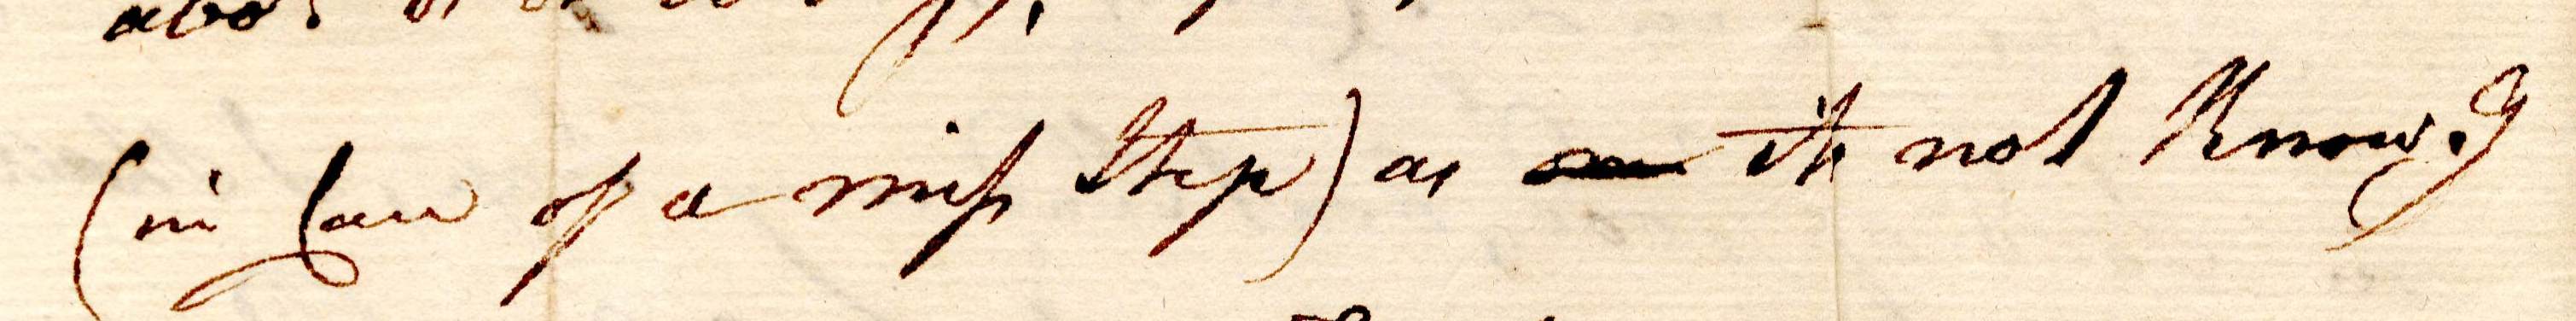(in Case of a misstep) as [__] it not know^g
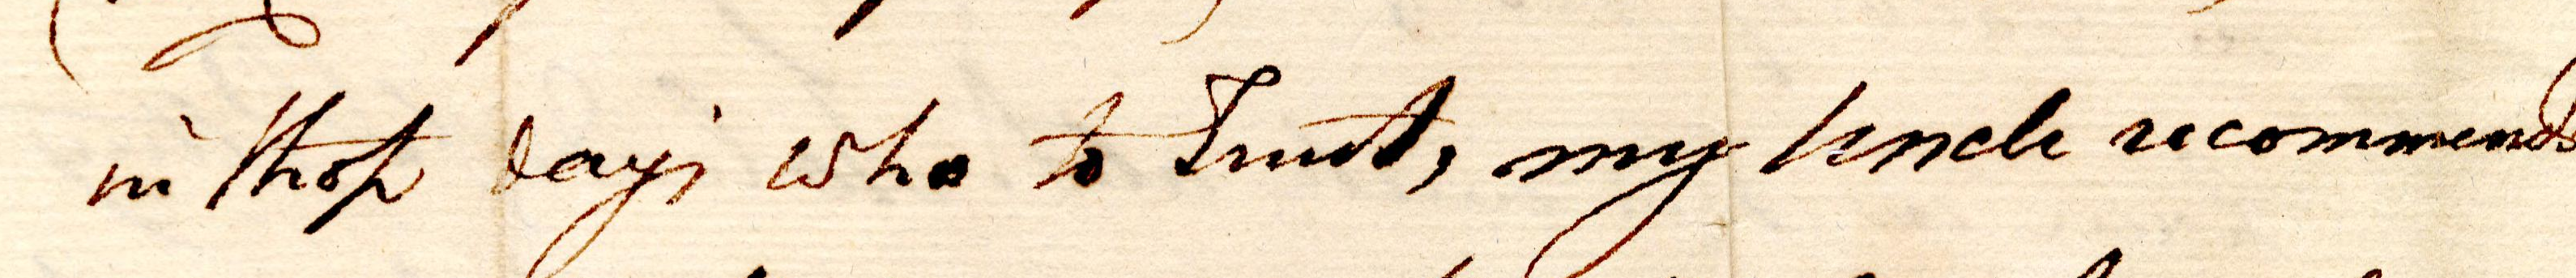in thoh days who to Trust, my Uncle recommends
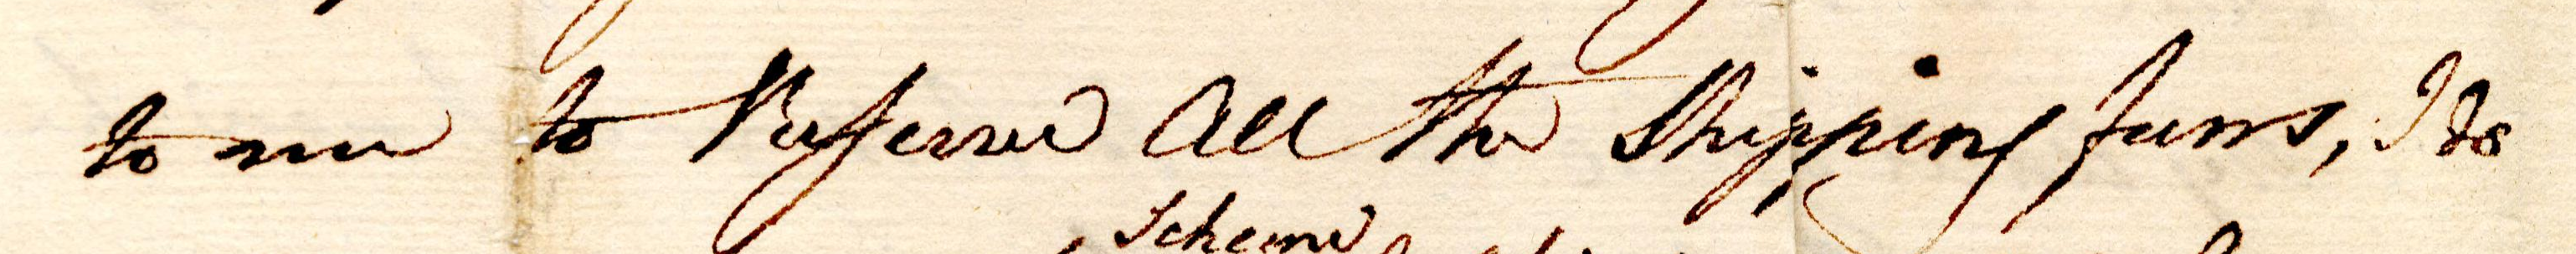to me to refund All the Shipping furrs, I do
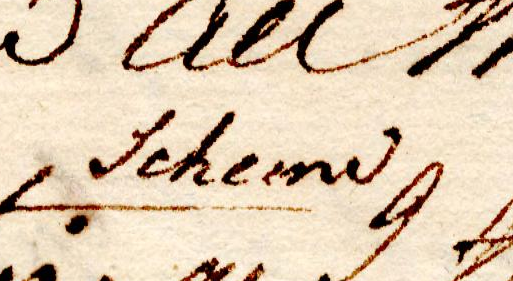scheme
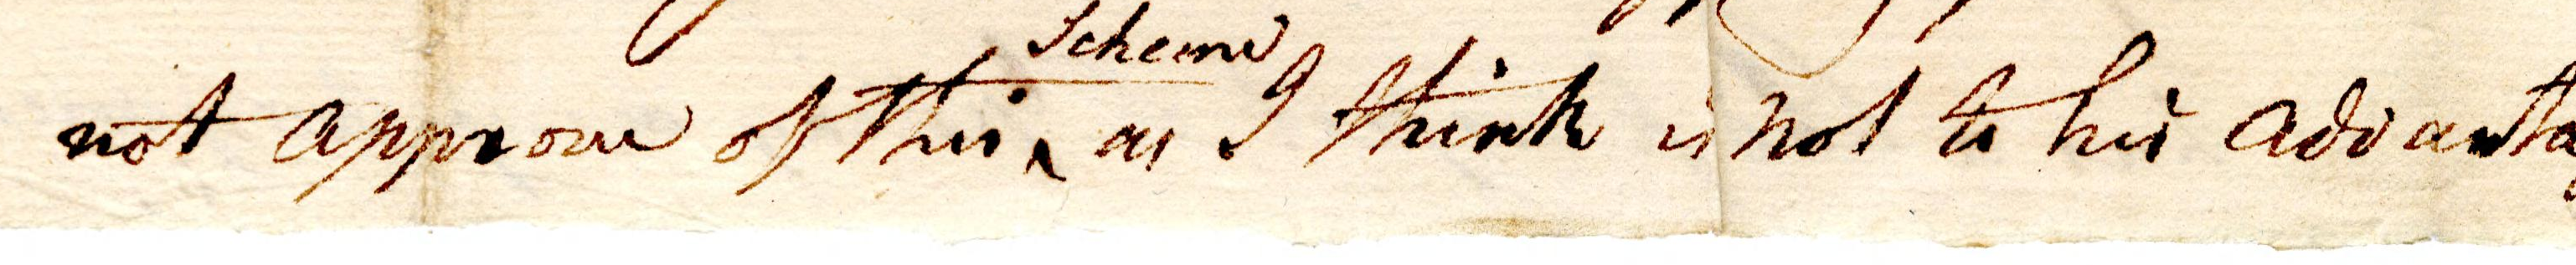not approve of this ^ as I think is not to his advantage
